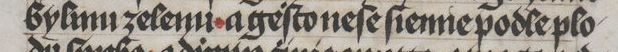bylinu zelenu.a geẛto neſe ſiemie podle plo¬
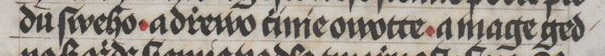du ſíveho.a dṙewo ċíníe owotce.a mage ged¬
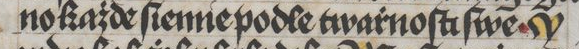no każde ſiemie podle twaṙnoſti ſwe.Y
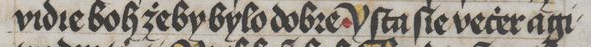vidie boh żeby bylo dobre.Vſta ſíe veċer agí¬
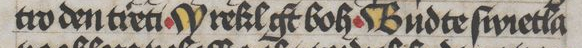tro den tṙetí.Y rekl ḡt boh.Budte ſwietla
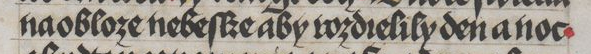naobloże nebeſke aby rozdielily den a noc.
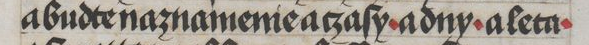a budte naznamenie a czaſy.a dny.a leta.
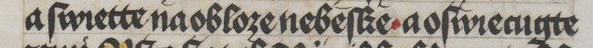a ſwiette na obloze nebeſke.a oſwiecugte
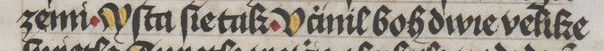zemi.Vſta ſietak.Vċínil boh dwie velike
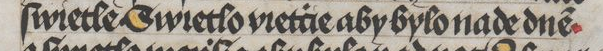ſwietle Swietlo vietċie aby bylo nade dnē.
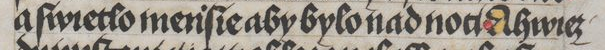a ſwietlo menẛíe aby bylo nad nocí.Ahwiez¬
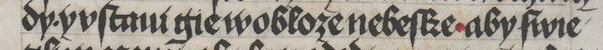dy.yvſtaní gie w obloze nebeſke.aby ſivie¬
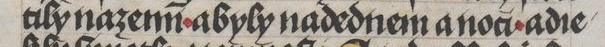tily nazemí.abyly nadednem a nocí.adie¬
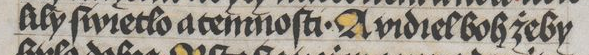lily wietlo a temnoſtí. A vidiel boh żeby
